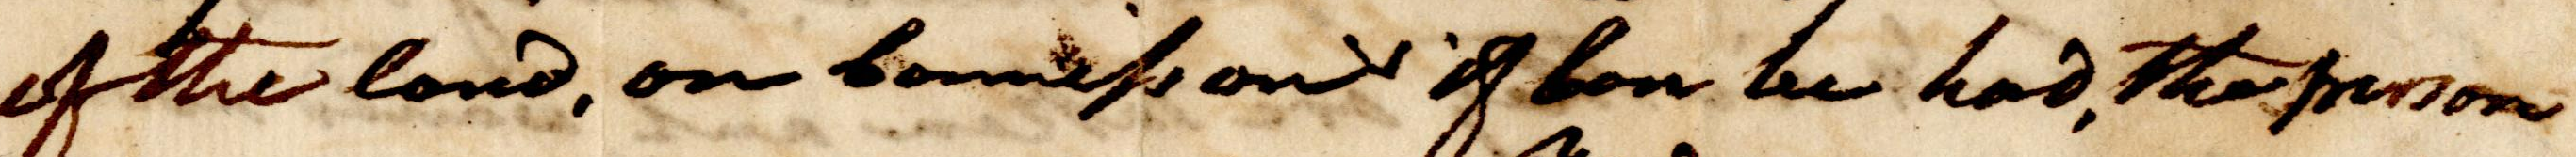of the land, on consist and if Can be had the person
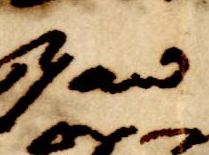you
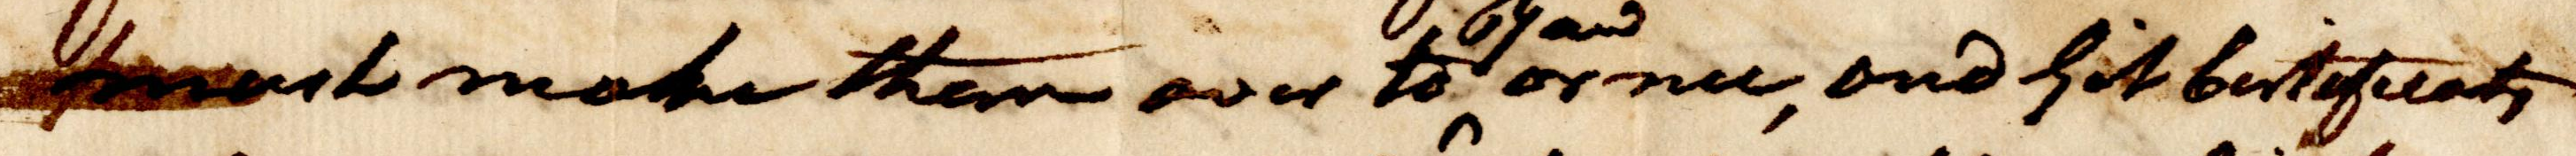remark make them over to ^ or me, and Git Certificates
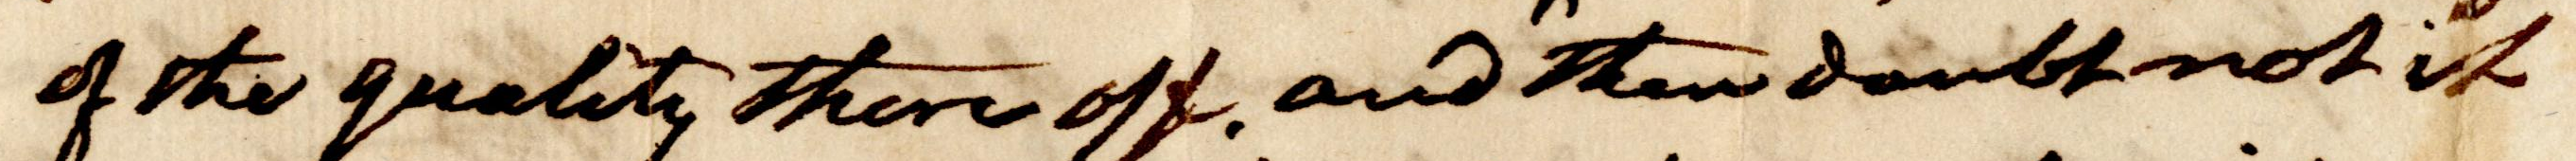of the quality there off, and then doubt not it
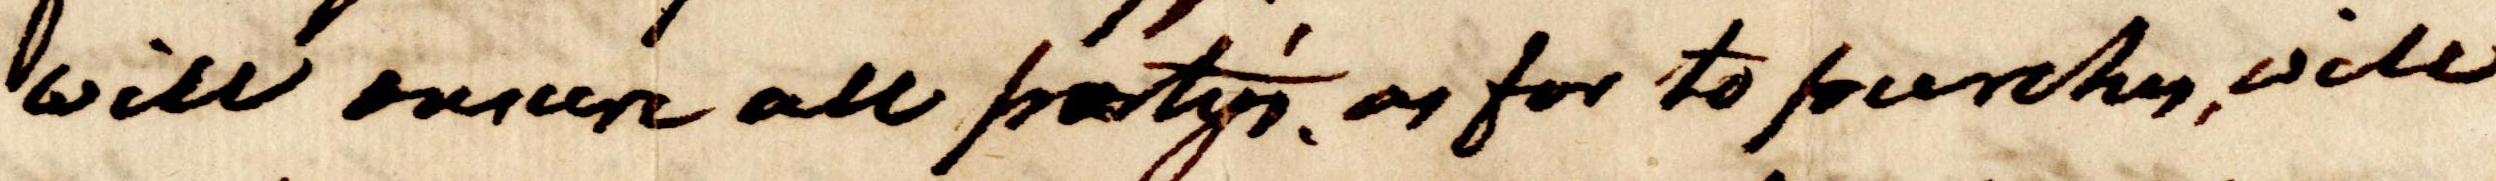will assure all party's as for to purchas, will
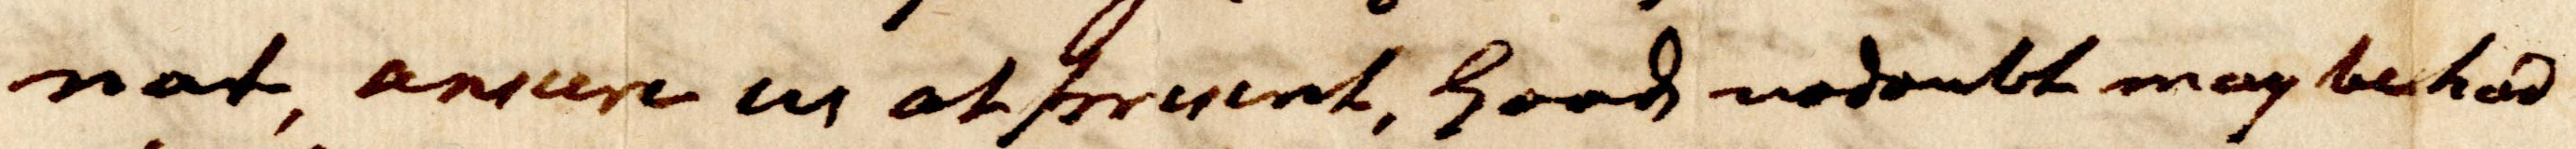not, answer us at present, Goods no doubt may be had
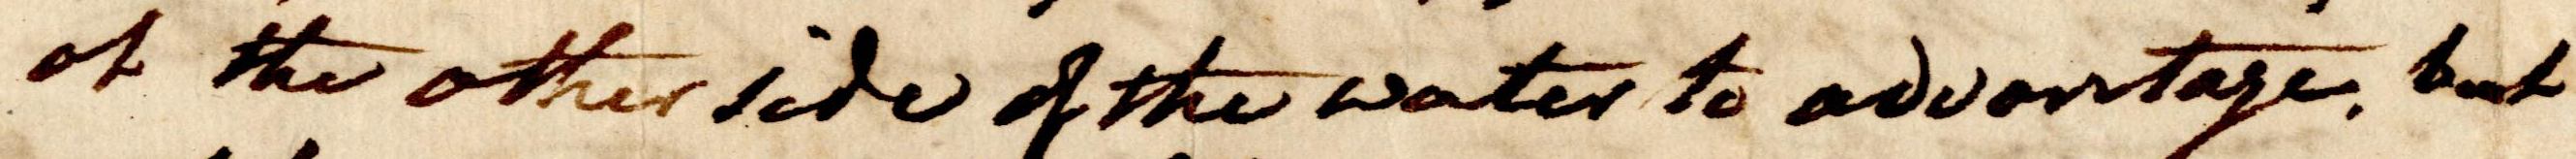at the other side of the water to advantage, but
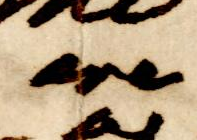are
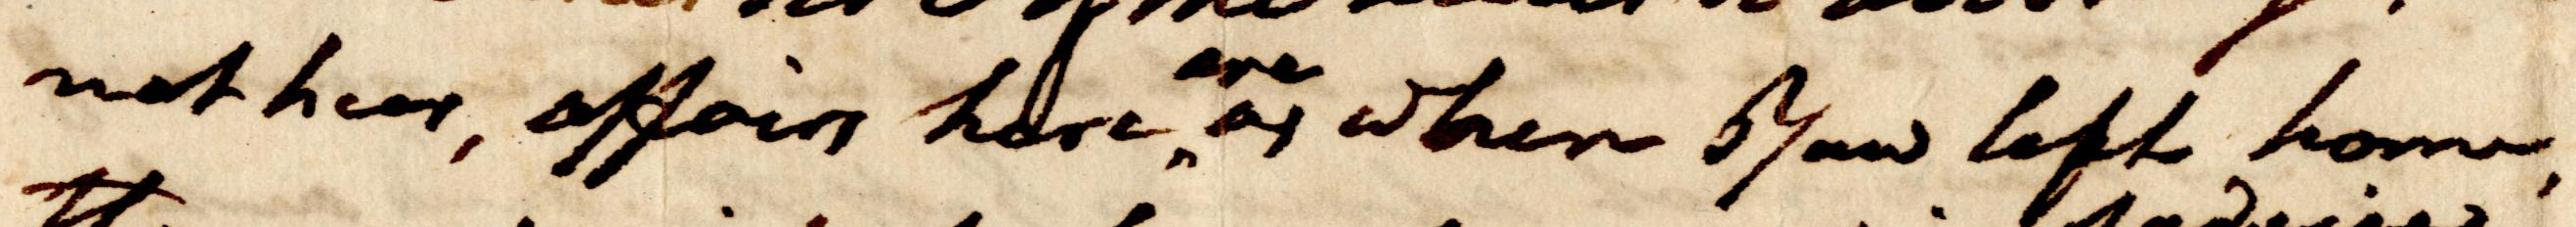not here, affairs here ^ as when you left home
